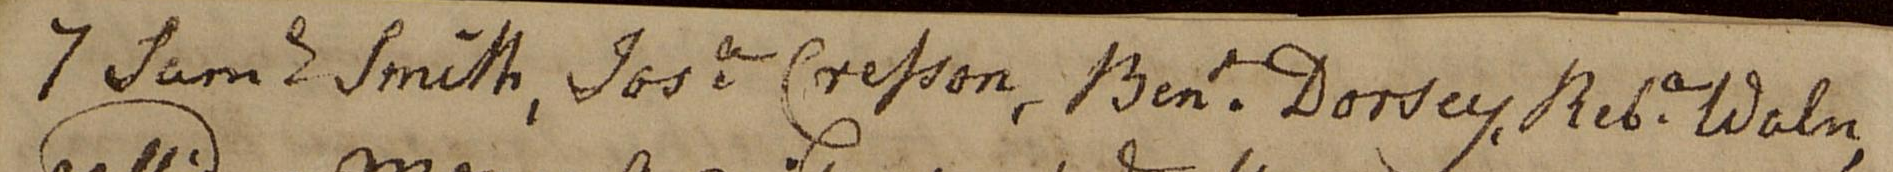7 Sam^l. Smith, Jos^a Cresson, Ben^j. Dorsey, Reb^a. Waln,
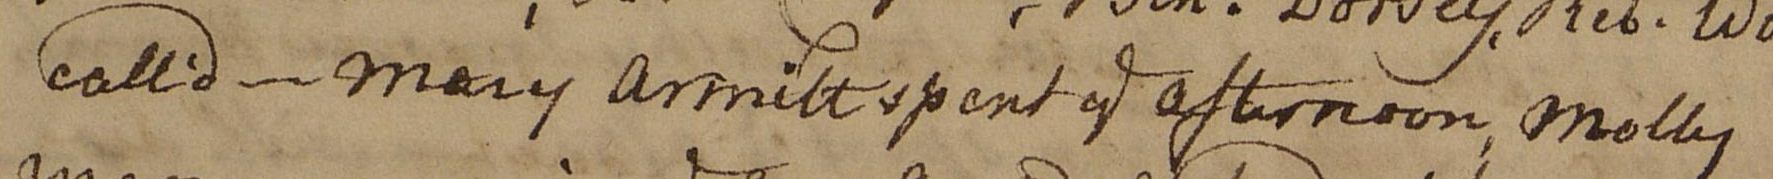call'd- Mary Armitt spent y^e afternoon, Molly
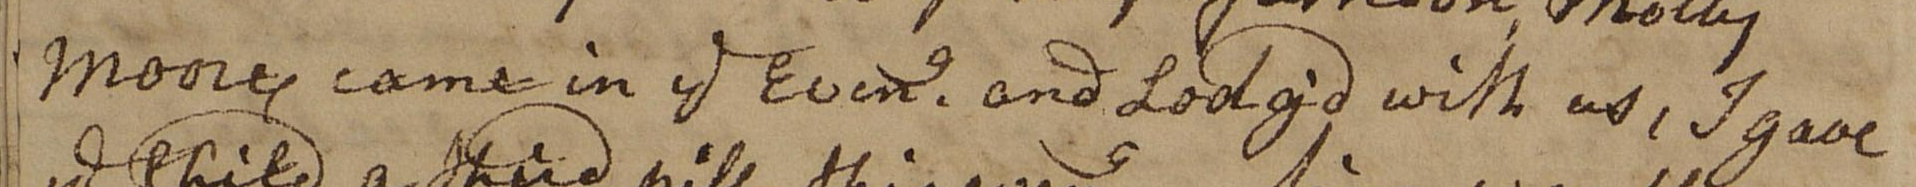Moory came in y^e Even^g. and Lodg'd with us, I gave
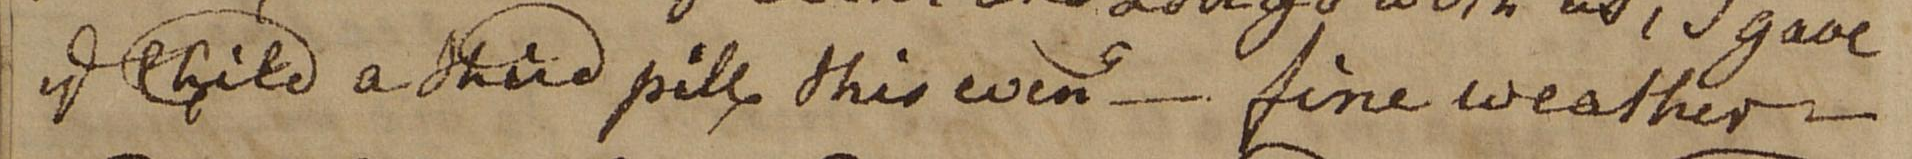y^e Child a third pill this even^g- fine weather-
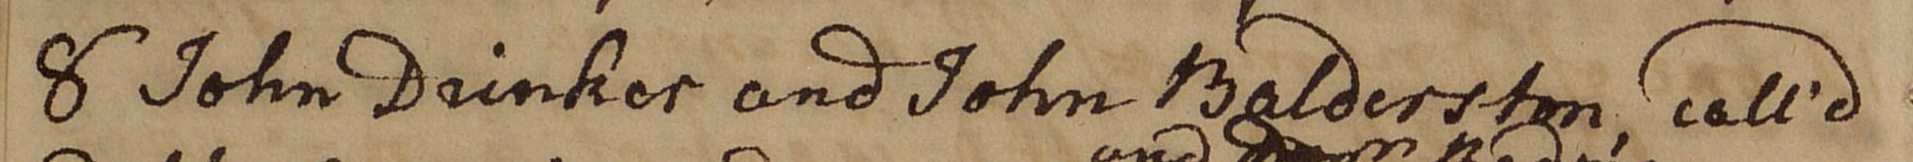8 John Drinker and John Balderston, call'd
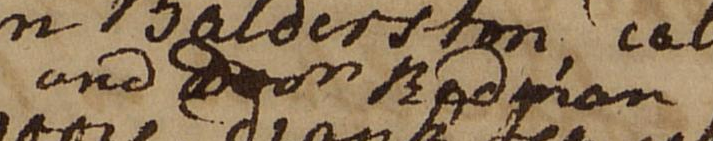and Doc^r Redman
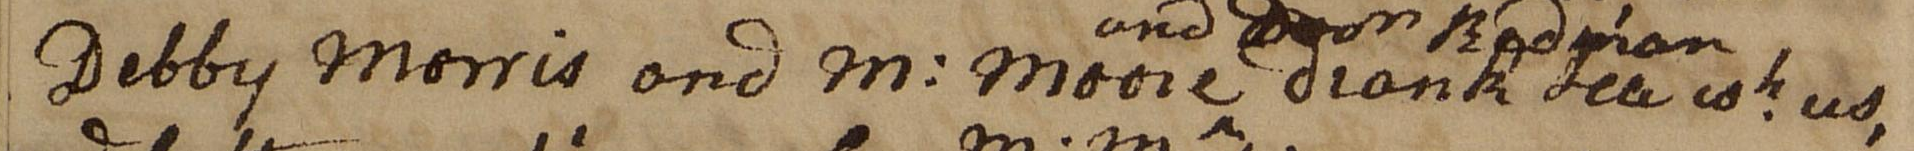Debby Morris and M: Moore drank tea w^h. us,
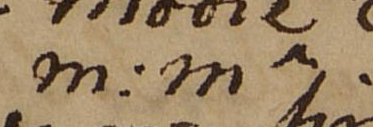M:M^
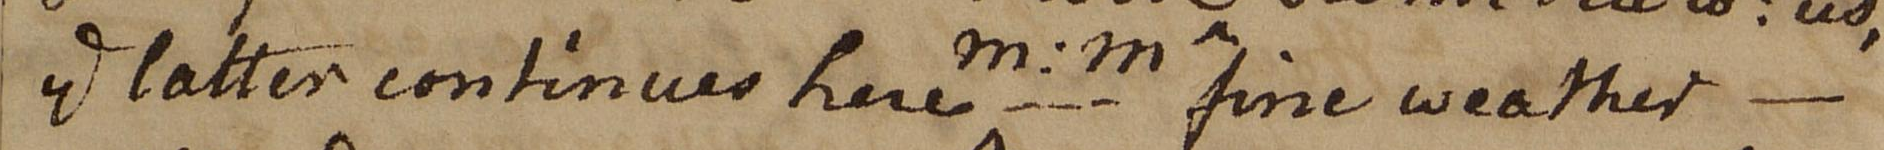y^e latter continues here--- fine weather-
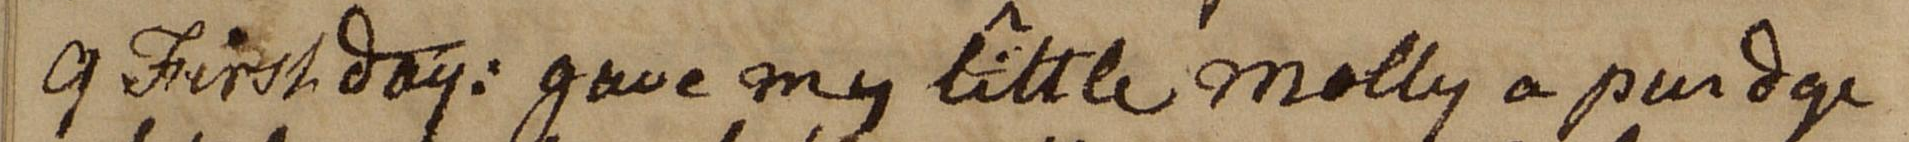9 First day: gave my little Molly a purdge
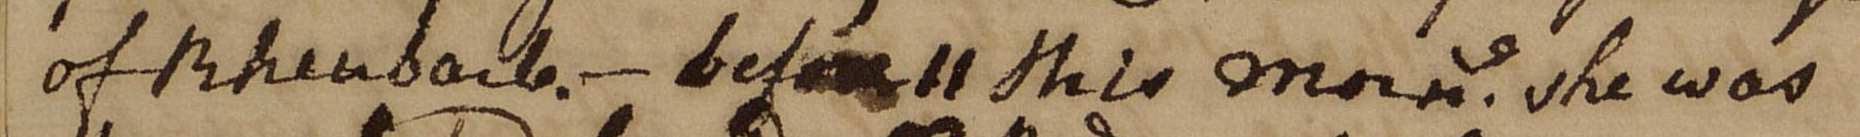of Rheubarb.- [before] 11 this morn^g. she was
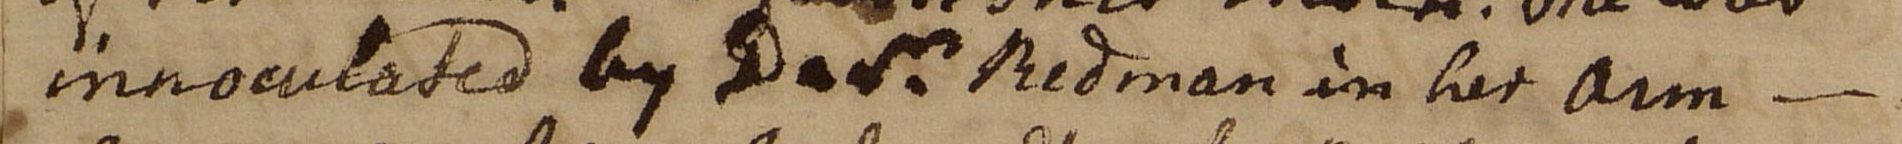innoculated by Doc^r. Redman in her arm-
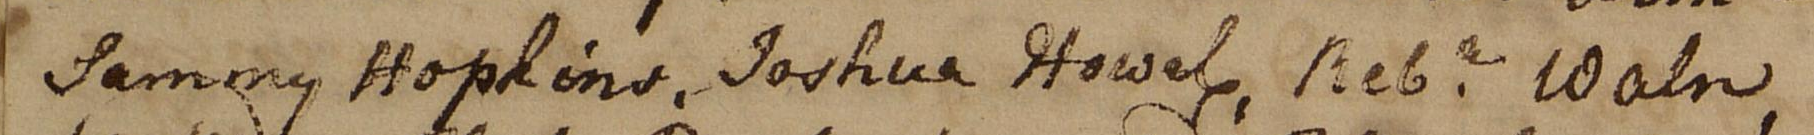Sammy Hopkins, Joshua Howel, Reb^a. Waln,
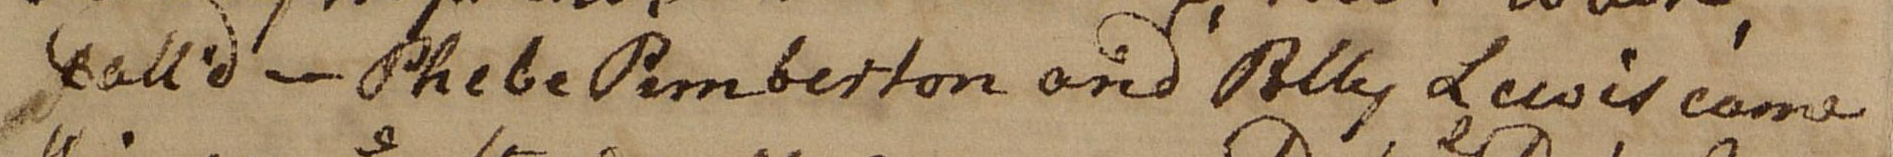call'd- Phebe Pemberton and Polly Lewis came
